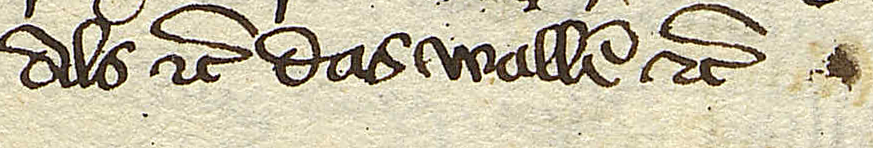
Als ec* das wolle* ec*
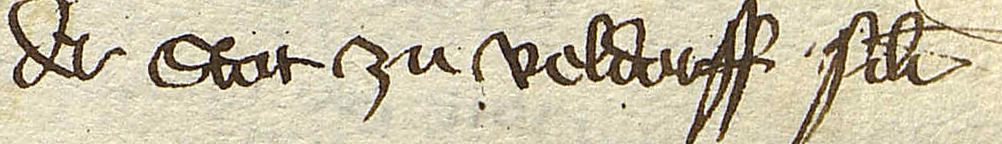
der Stat cʒu veldorff ſilr*
